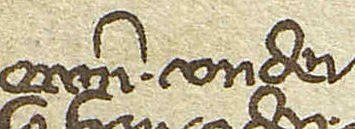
ewn* . vnder
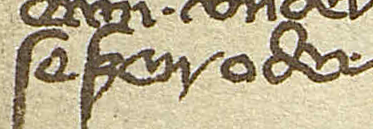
ſeſʒen / oder
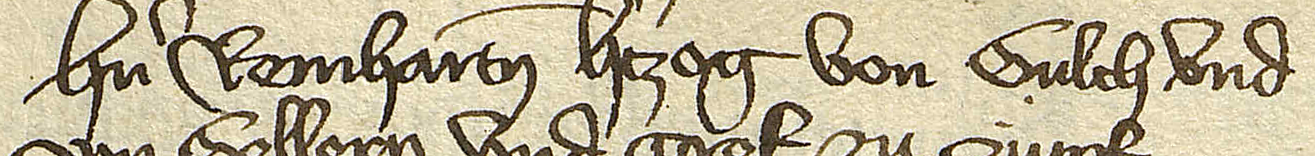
hn* Reinhartn* h*cʒog von Gulch vnd
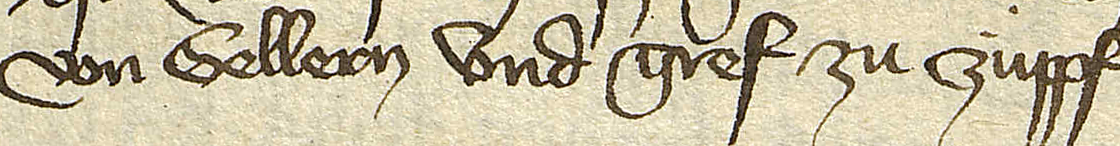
von Gellern vnd gref cʒu cʒüppf
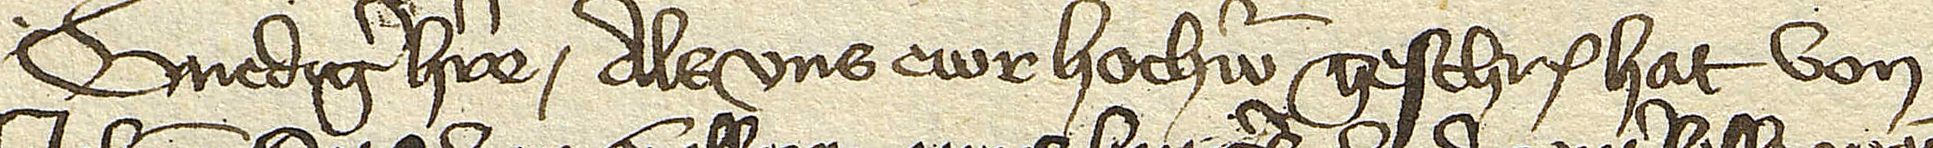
Gnedig* h*re / Als vns ewr hochw* geſchr* aht von
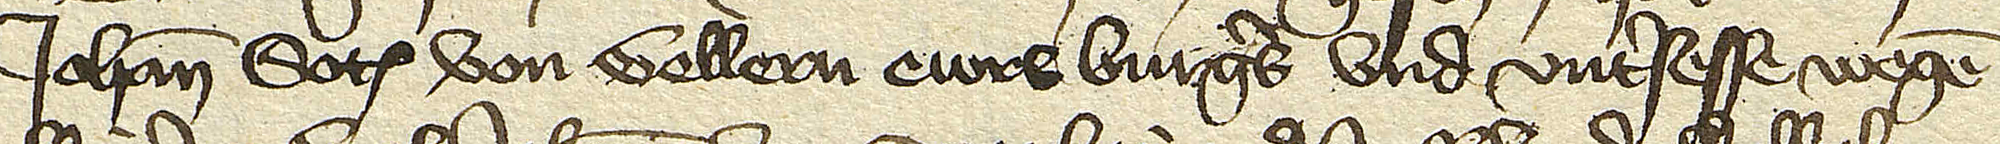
Iohan* Sot* von Gellern ewrs burgs* vnd vnt*ſeſſe wege*
